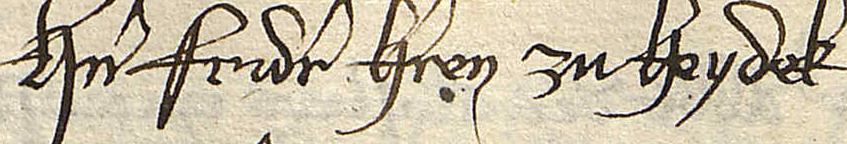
Hn* Fridr* h*ren ʒu Heydek
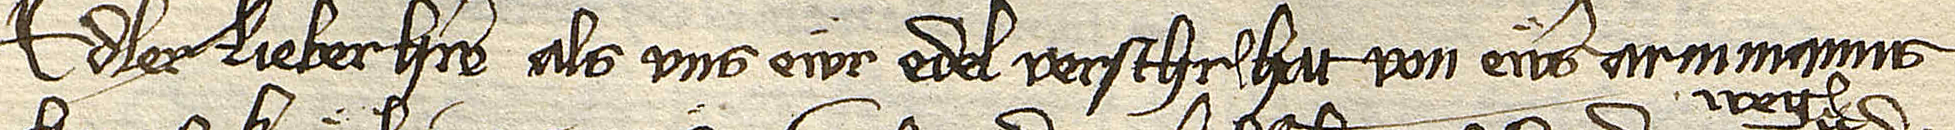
Edler lieber h*re als vns eẅr edel verſchr* hat von eẅ*s armmanns
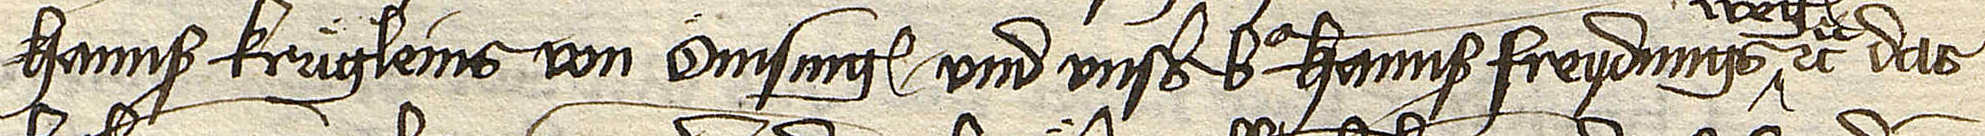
hannſ* krügleins von Ömſing* / vnd vnſ*s b* hannſ* freydungs ec* das
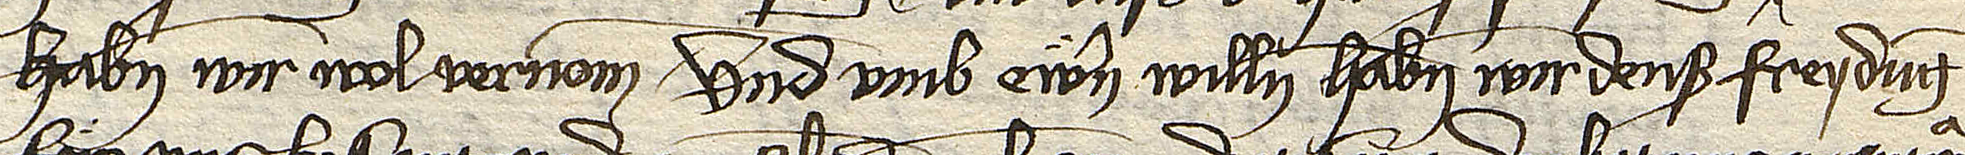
habn* wir wol vernom* / Vnd vmb eẅ*n willn* habn* wir denſ* freydu*g
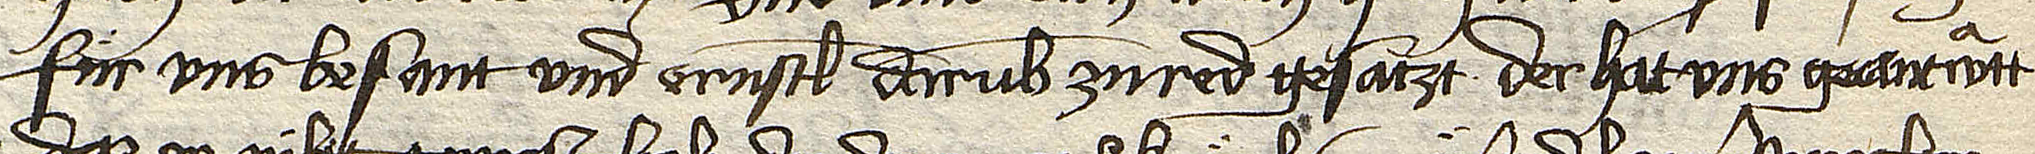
für vns beſant vnd ernſtl* darub* ʒured geſacʒt der hat vns geantw*tt
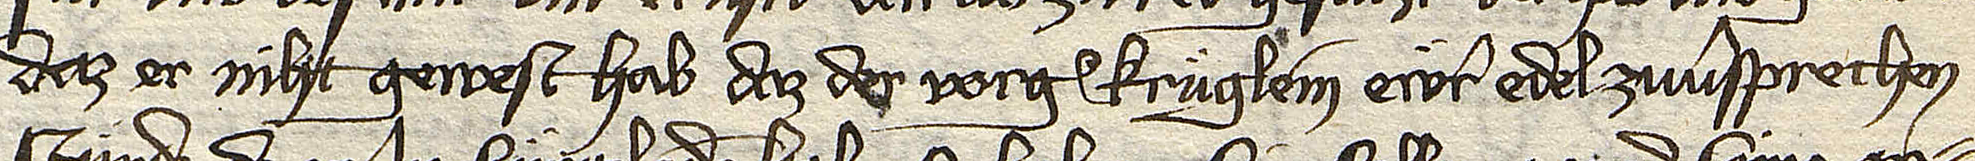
daʒ er niht geweſt hab daʒ der vorg* krüglein eẅr* edel ʒuu*ſprechen
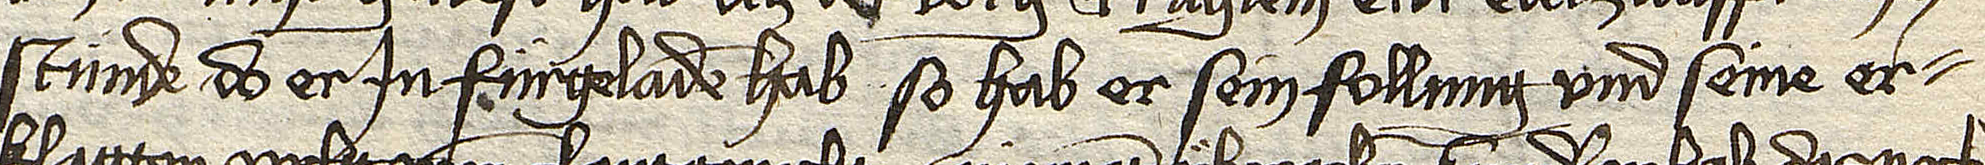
ſtünde / do er In fürgelade* hab ſo hab er ſein follung vnd ſeine er =
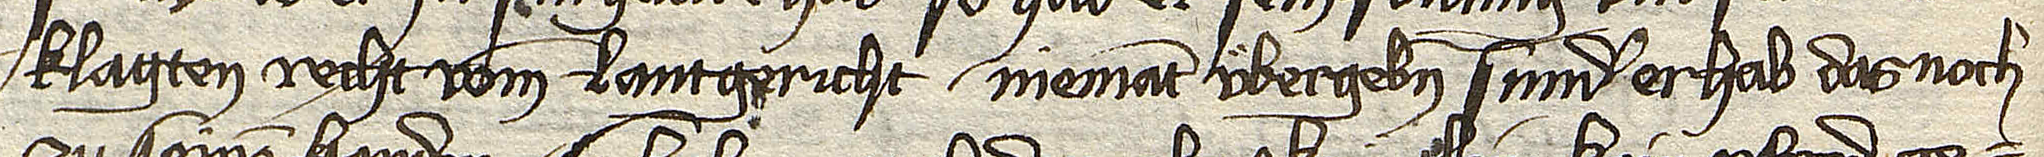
klagten recht vom* lantgericht niema*t v̈bergebn* ſund* er hab das noch
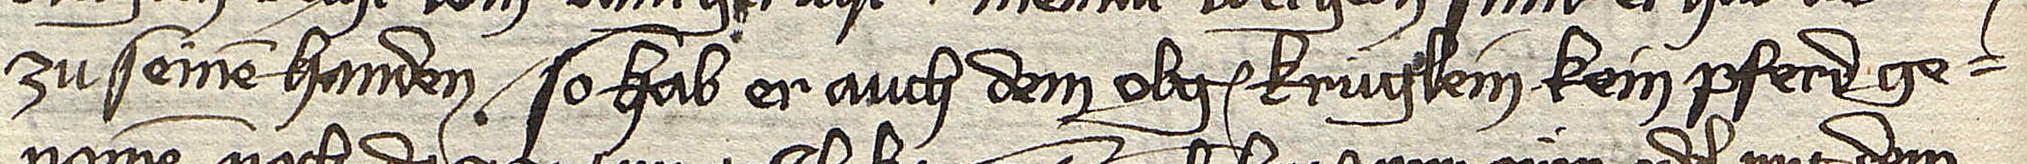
ʒu ſeine* handen / ſo hab er auch dem obg* krüglein kein pferd ge =
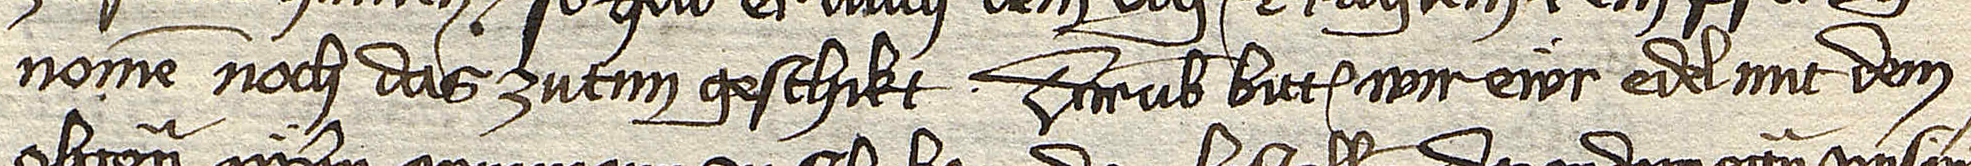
nome* noch das ʒu tun geſchikt . Darub* bitt* wir eẅr edel mit dem
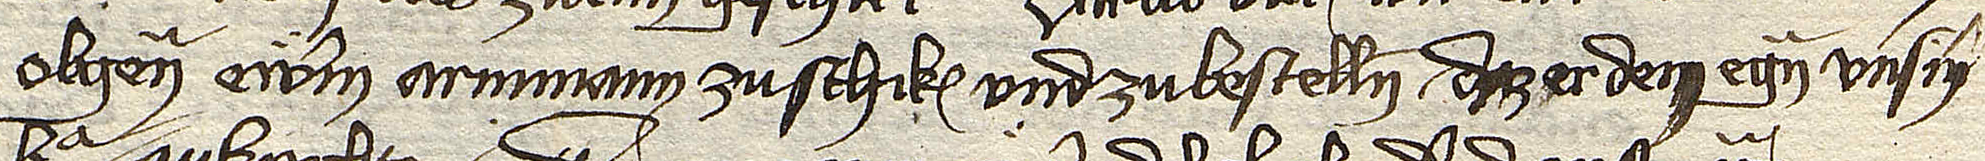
obgen* eẅ*m armmann ʒu ſchik* vnd ʒu beſtelln* / daʒ er dem egn* vnſm*
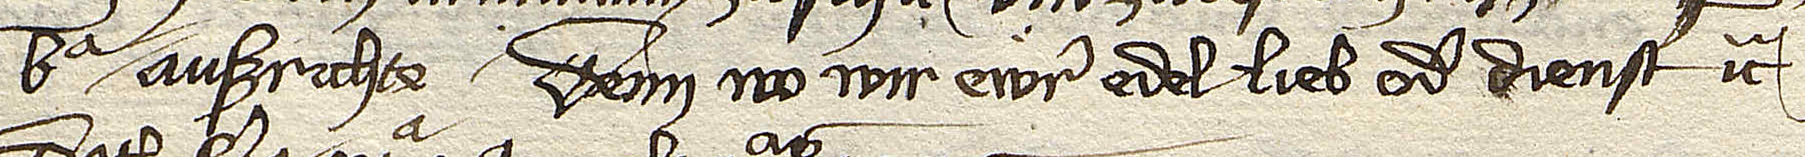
b* / auſʒrichte / Denn wo wir eẅr* edel lieb od* dienſt ec*
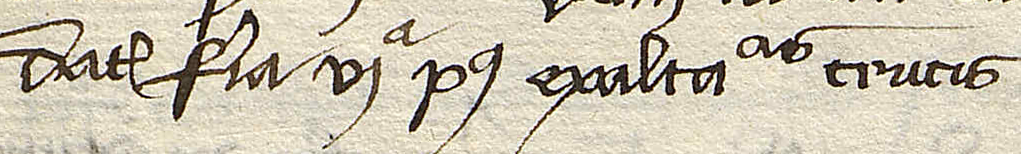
Dat* fi*a vi* p* exalta* crucis
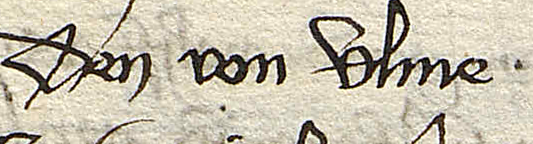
Den von Vlme
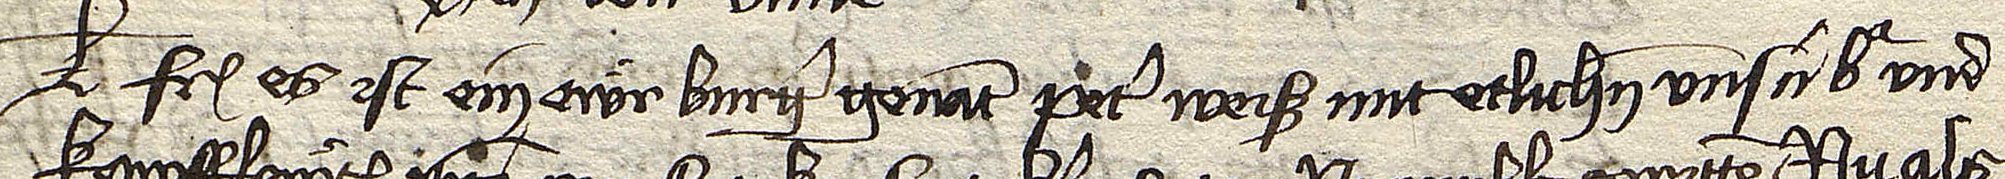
L* fr* es iſt ein eẅr burg* gena*t Pet* weiſʒ mit etlichn* vnſn* b* vnd
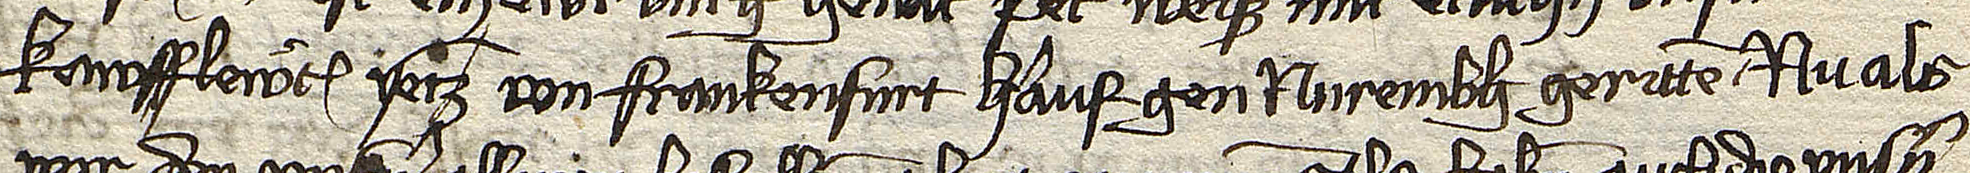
kawffleẅt* yecʒ* von frankenfurt h*auf gen Nuremb*g geritte* / Nu als
